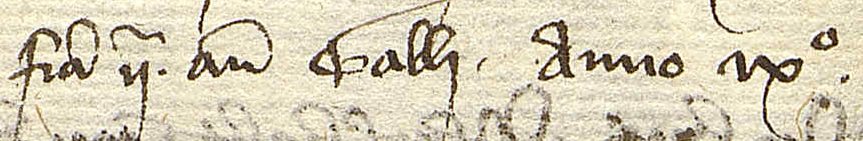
fia* ii* an* Galli / Anno ix* .
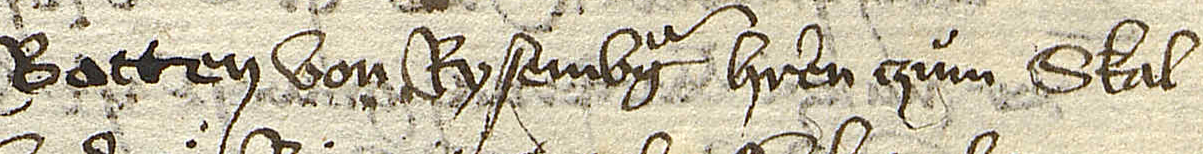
Botten von Ryſembg* hr*en cʒüm Skal
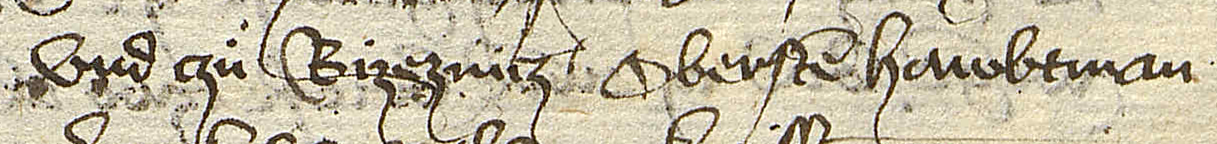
vnd cʒü Biʒeʒnicʒ / Oberſte* hawbtman
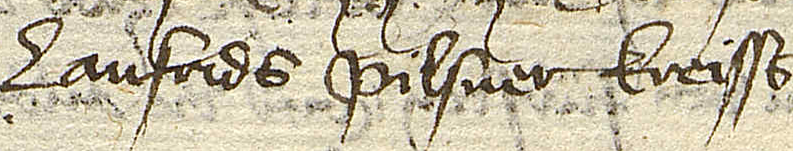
Lanfrids Pilſner kreiſſs
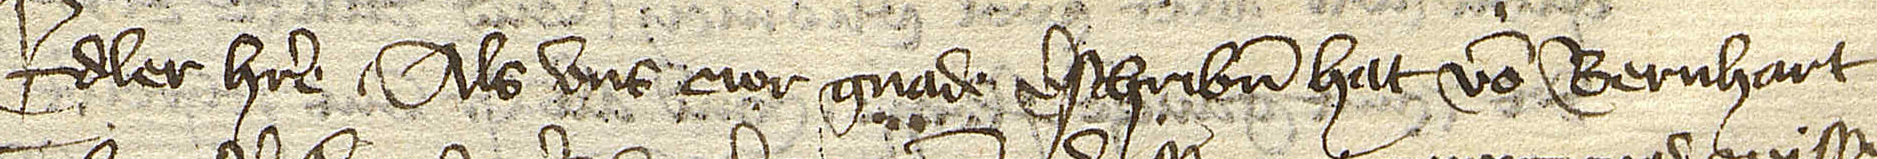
Edler hre* / Als vns ewr gnade v*ſchribn* hat vo* Bernhart
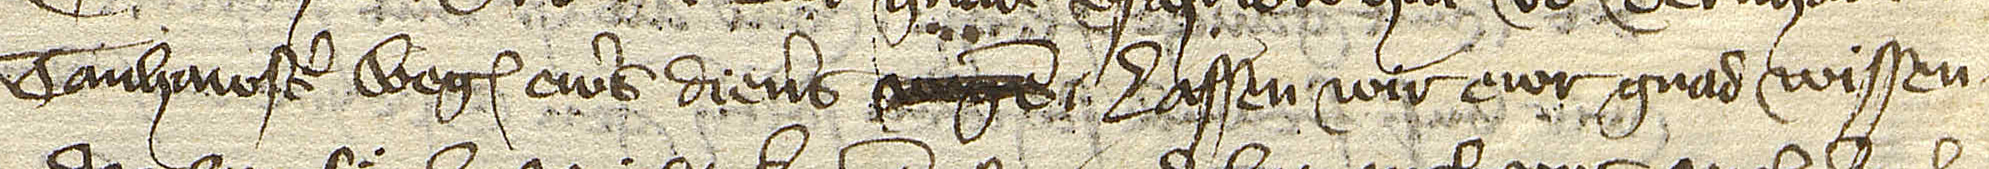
Tanhawſs* weg* ew*s dien*s wege* / Laſſen wir ewr gnad wiſſen /
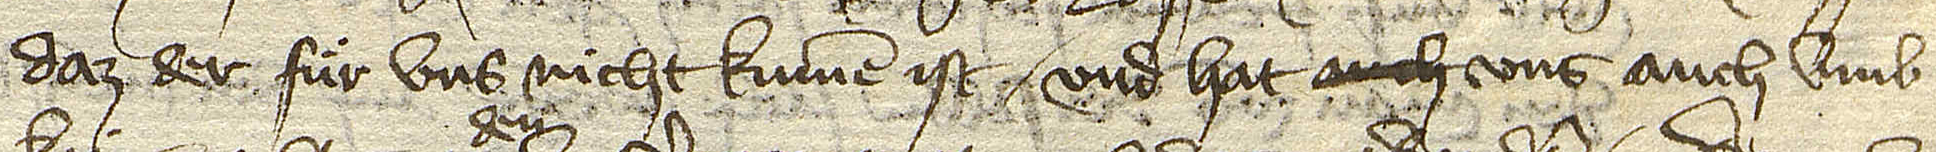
daʒ der für vns nicht kume* iſt / vnd hat auch vns auch vmb
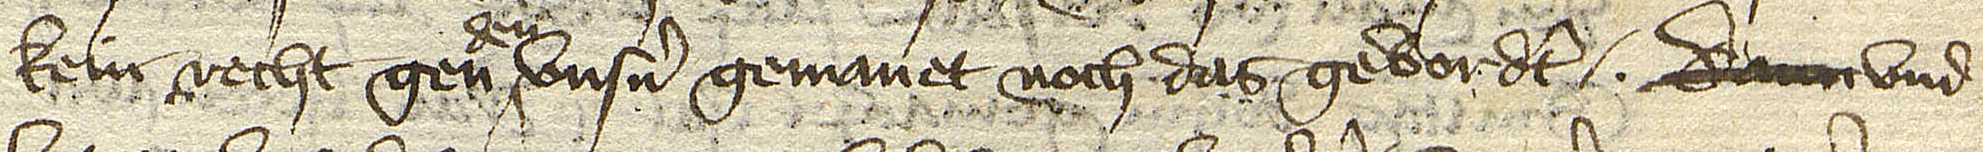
kein recht gen vnſn* gemanet noch das gevordt* /. Dauon vnd
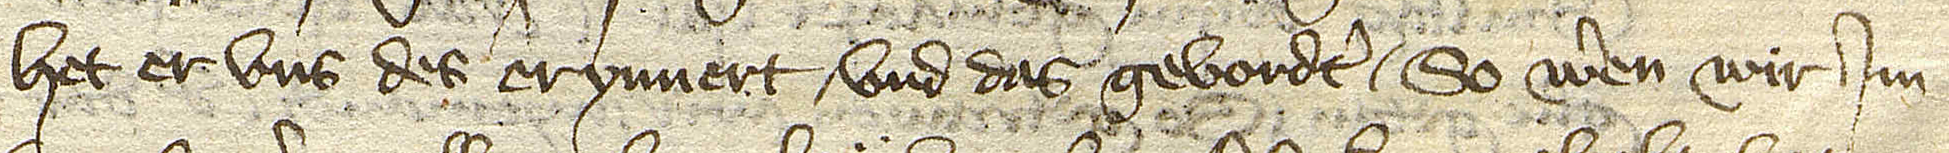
het er vns des erynnert / vnd das gevordt* / So wen* wir Im
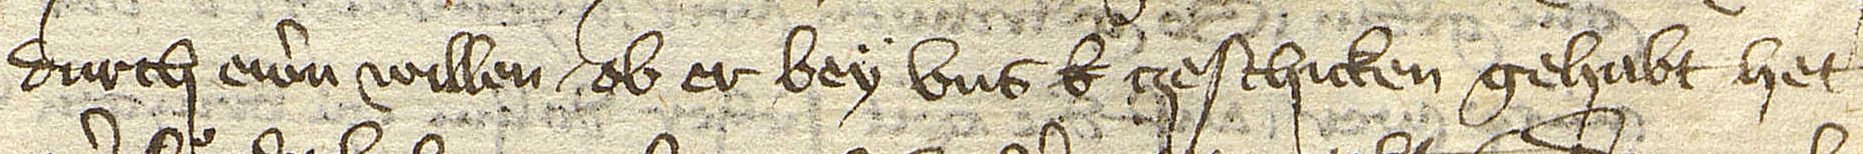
durch ewn* willen / ob er bey vns b cʒeſchicken gehabt het
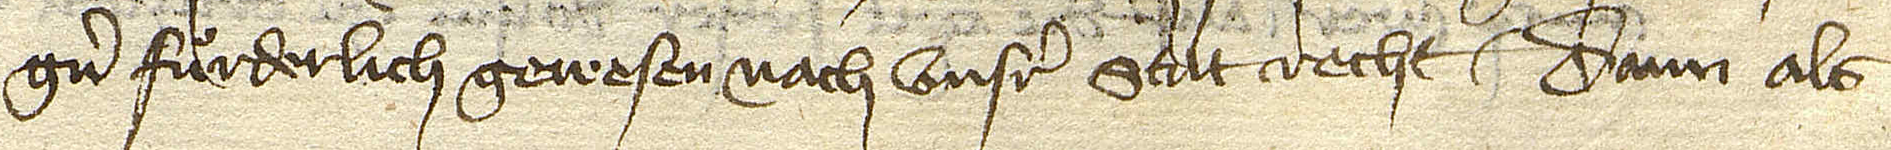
gn* fürderlich geweſen nach vnſr* Stat recht / Dann als
